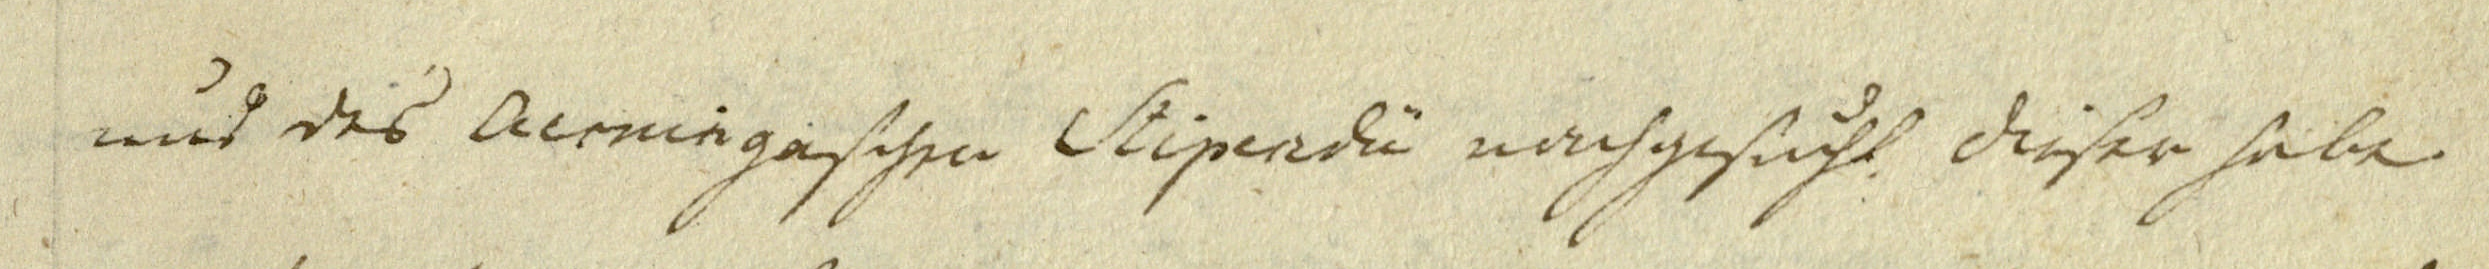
und des Aemingaschen Stipendii nachgesucht, dieser habe
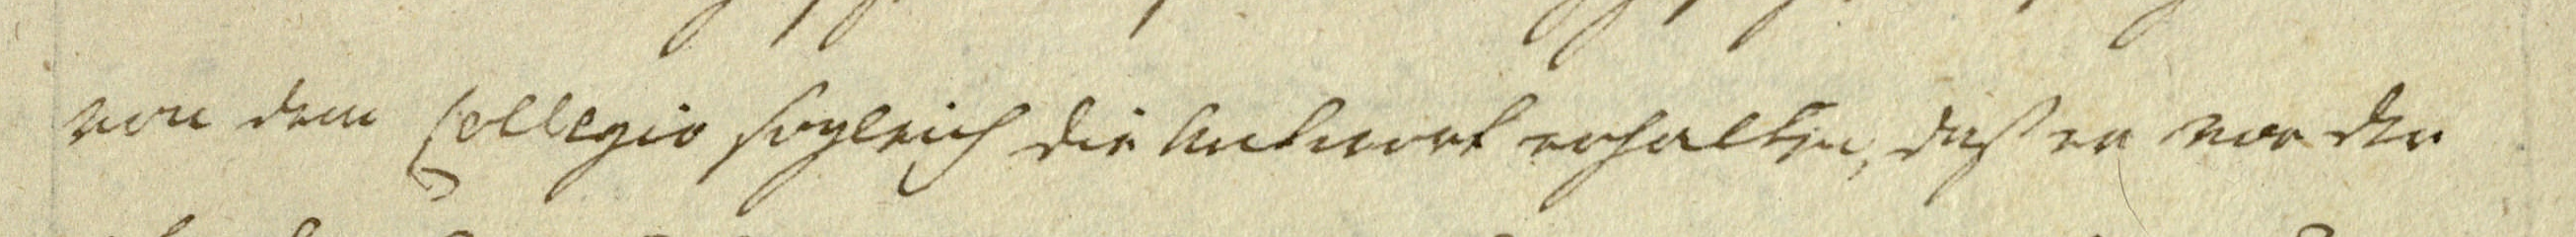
von dem Collegio sogleich die Antwort erhalten, daß er vor der
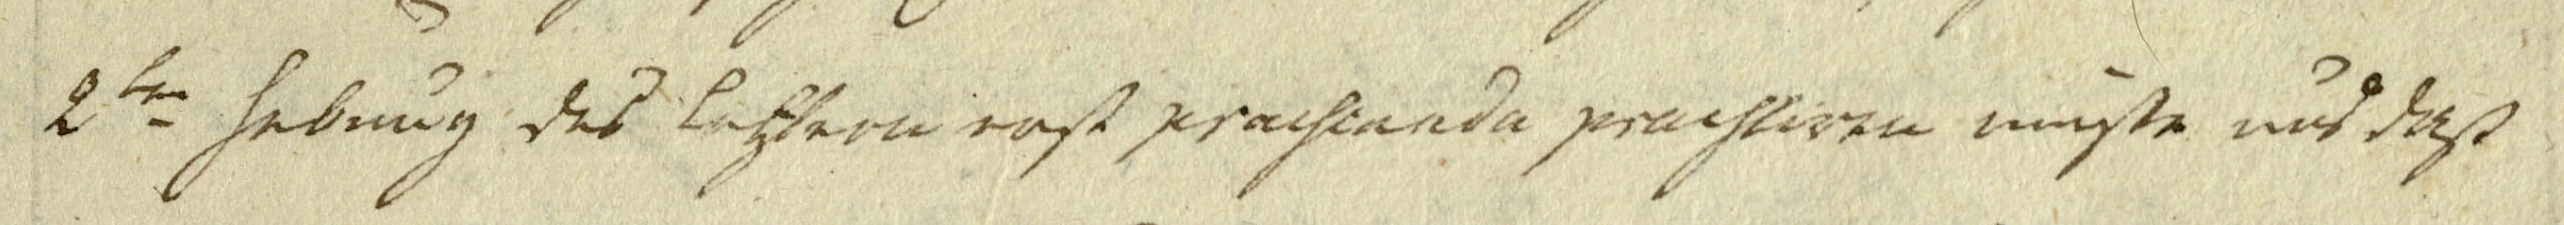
2 ten Hebung des letztern erst praestanda praestiren müsse und daß
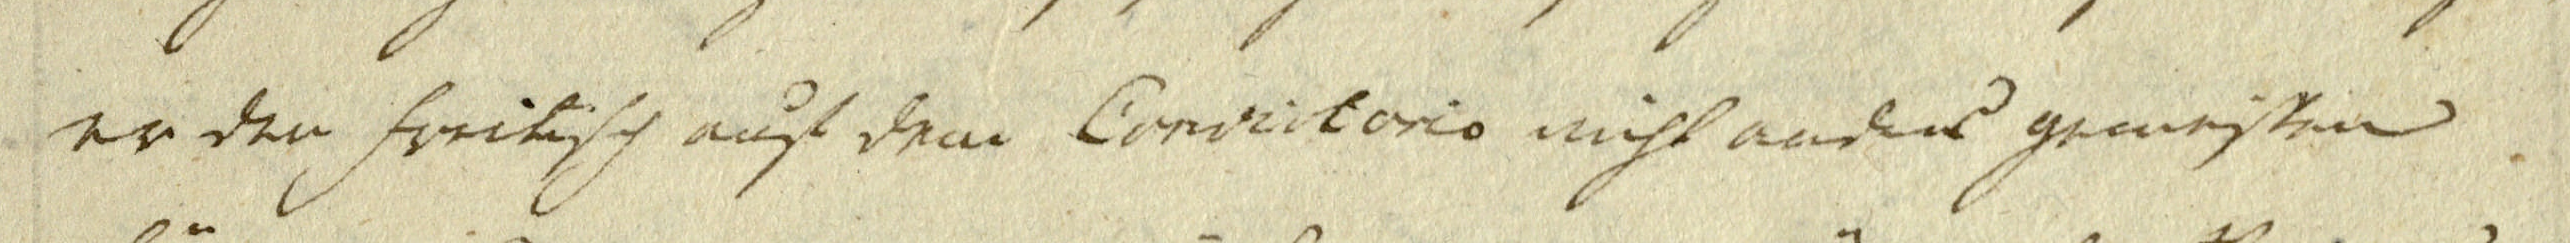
er den Freitisch auf dem Convictorio nicht anders geniessen
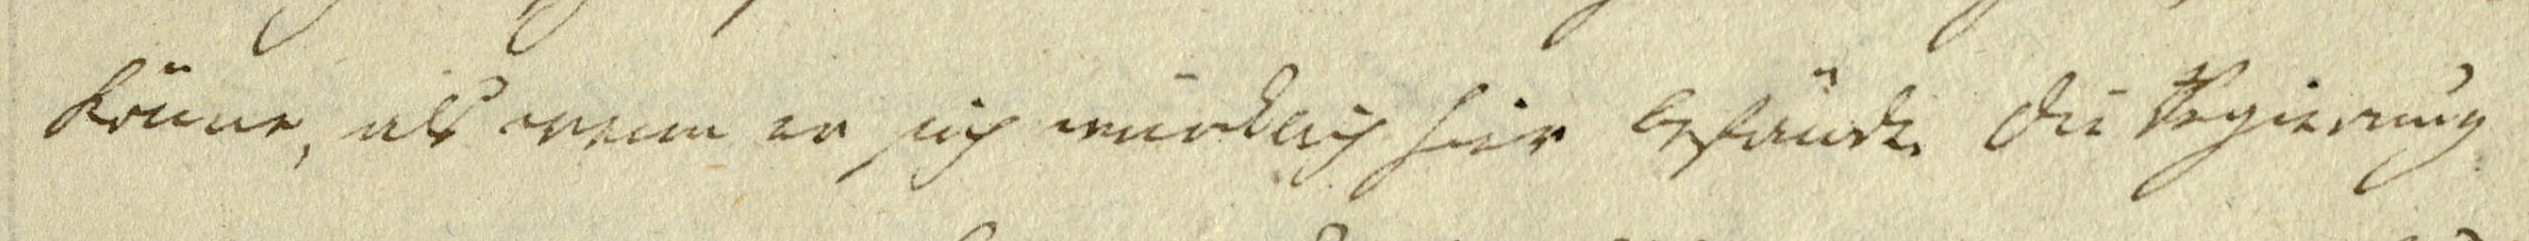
könne, als wenn er sich würcklich hier befände. Die Regierung
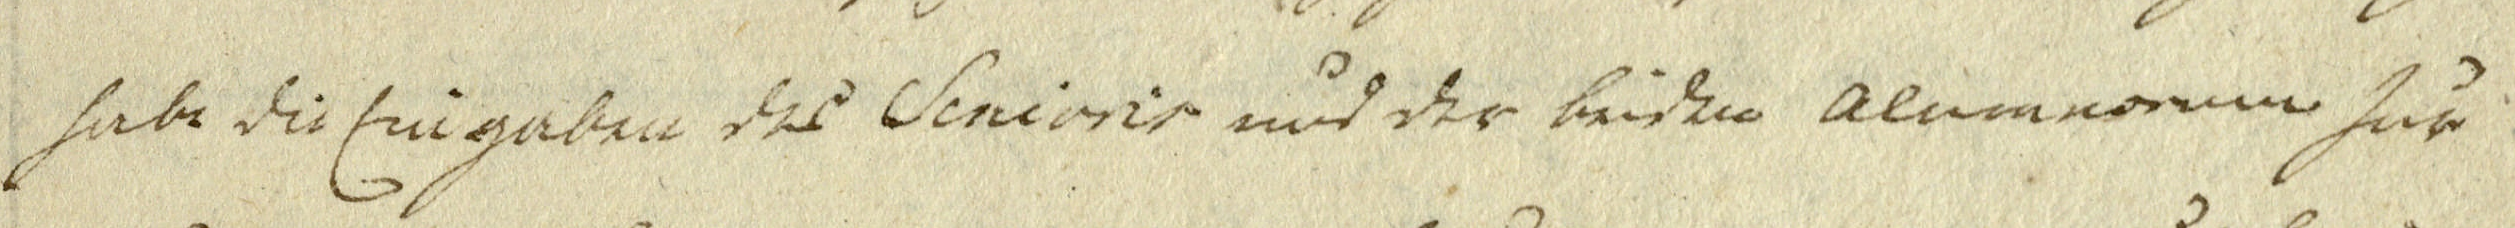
habe die Eingaben des Senioris und der beiden Alumnorum zur
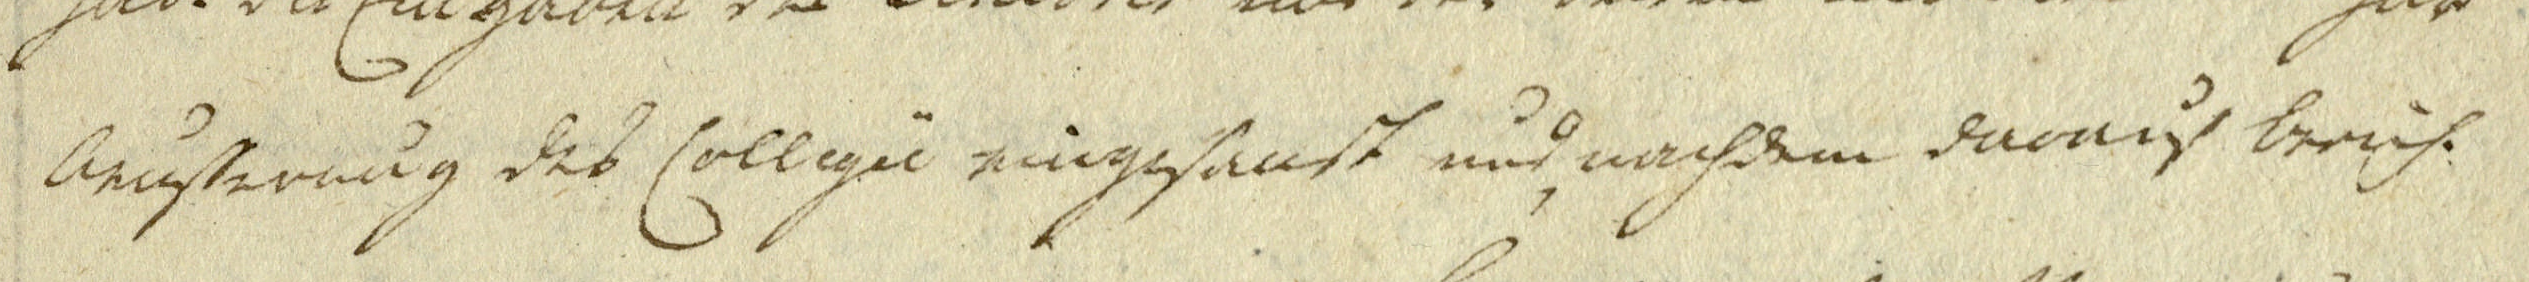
Aeusserung des Collegii eingesandt und nachdem darauf berich¬
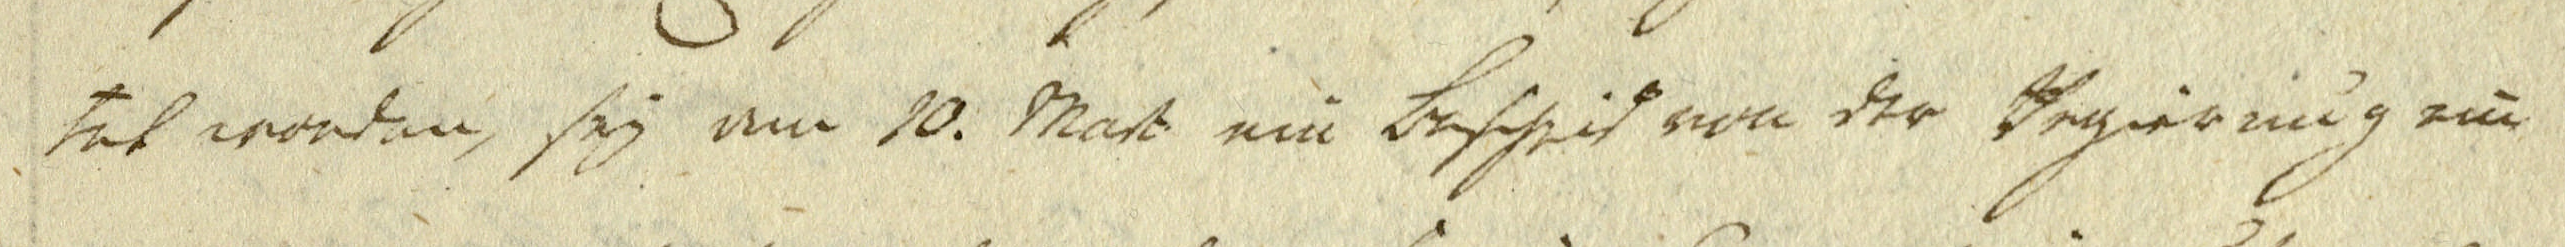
tet worden, seÿ am 10. Mart ein Bescheid von der Regierung ein¬
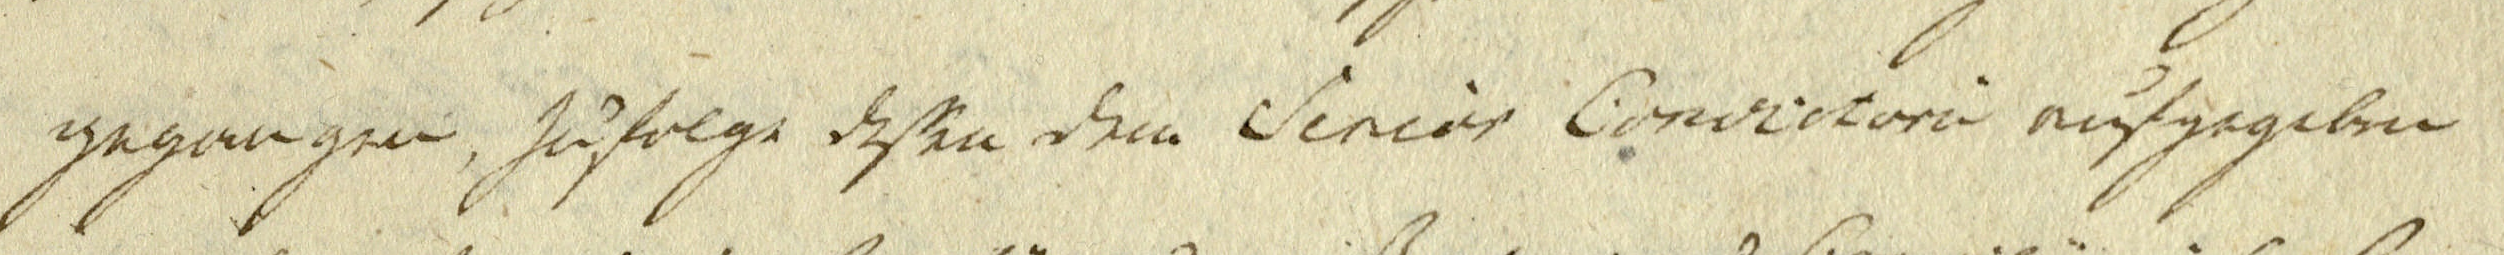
gegangen, zufolge dessen dem Senior Convictorii aufgegeben
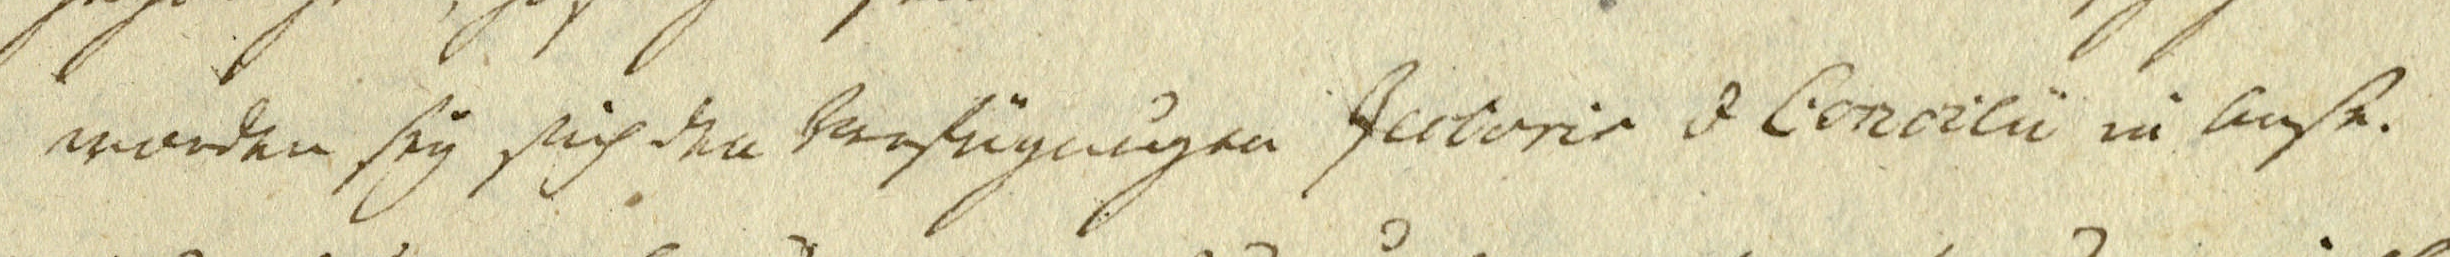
worden seÿ, sich den Verfügungen Rectoris et Concilii in Anse¬
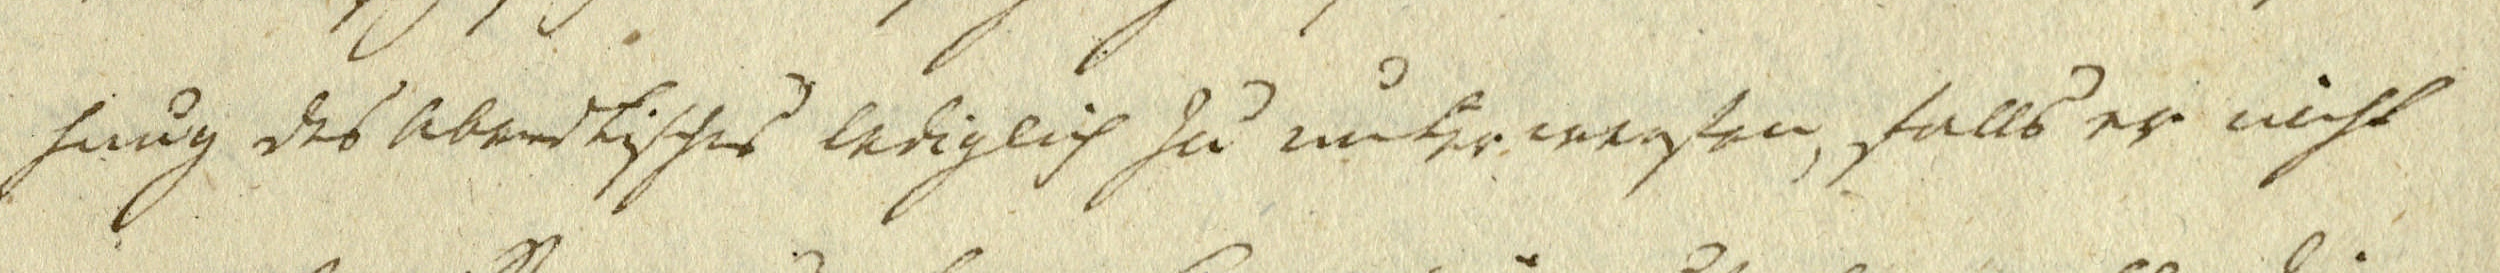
hung des Abendtisches lediglich zu unterwerfen, falls er nicht
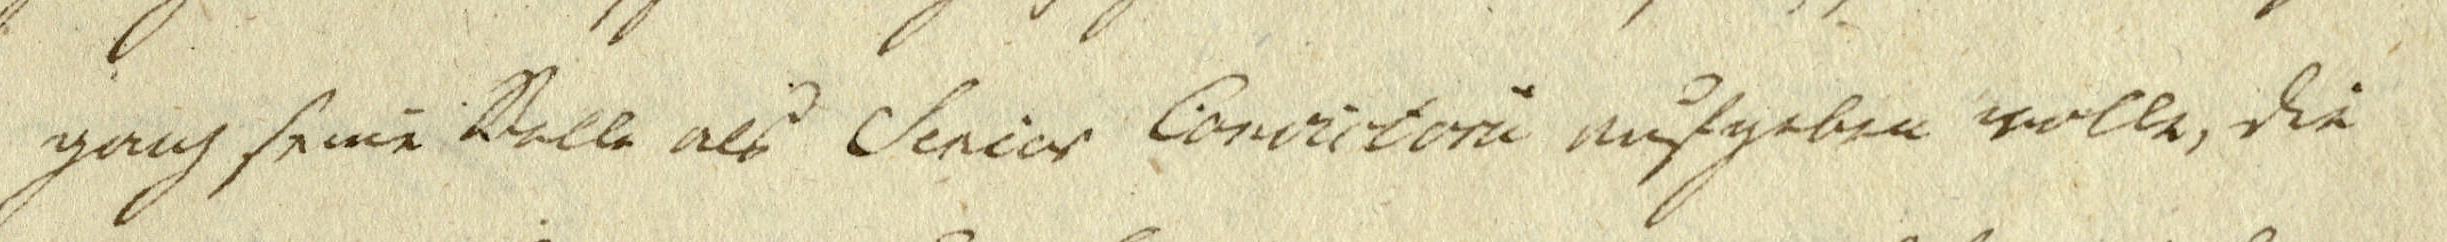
ganz seine Stelle als Senior Convictorii aufgeben wolle, die
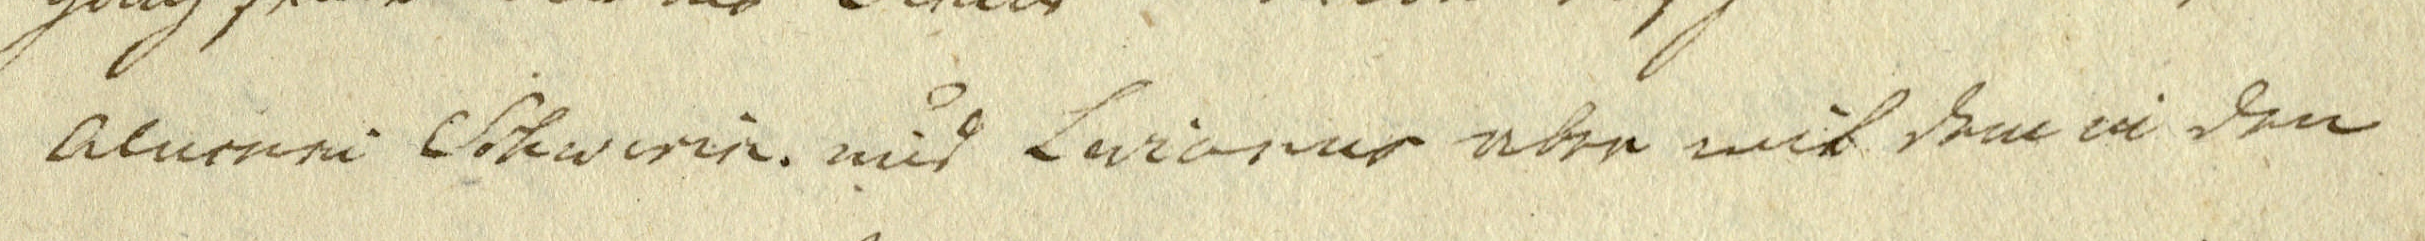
Alumni Schwerin. und Levianus aber mit dem in den
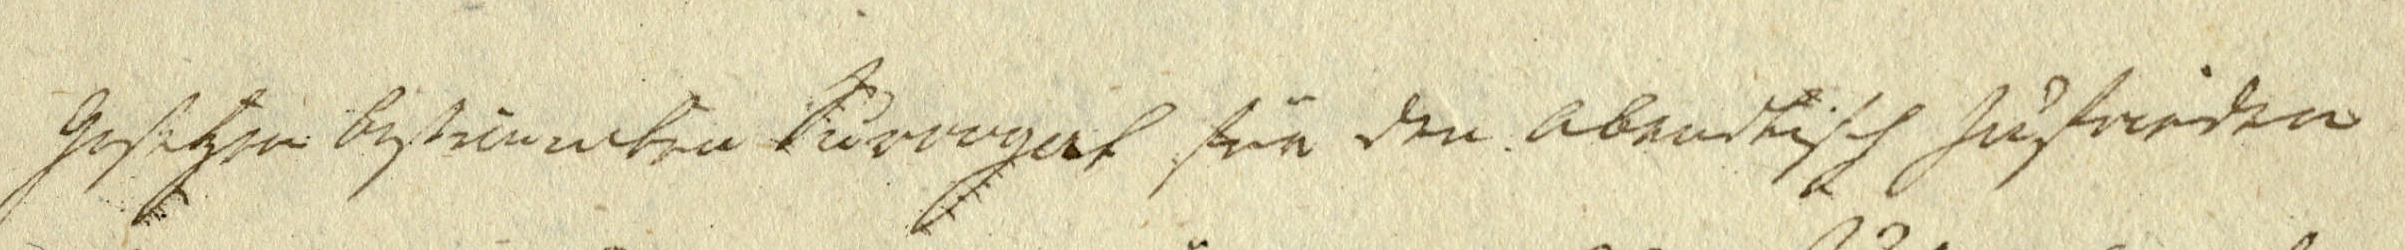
Gesetzen bestimmten Surrogat für den Abendtisch zufrieden
